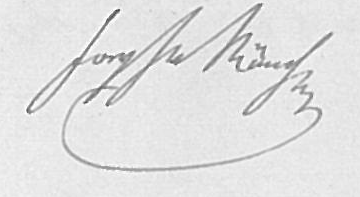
Freyh v Münch
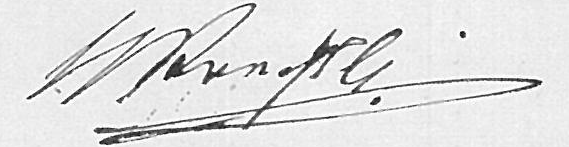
JJPrechtl
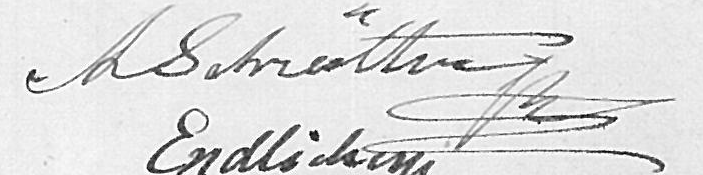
A Schrötter
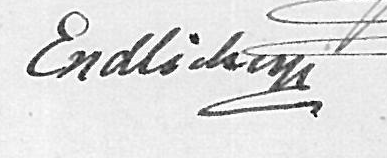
Endlicher
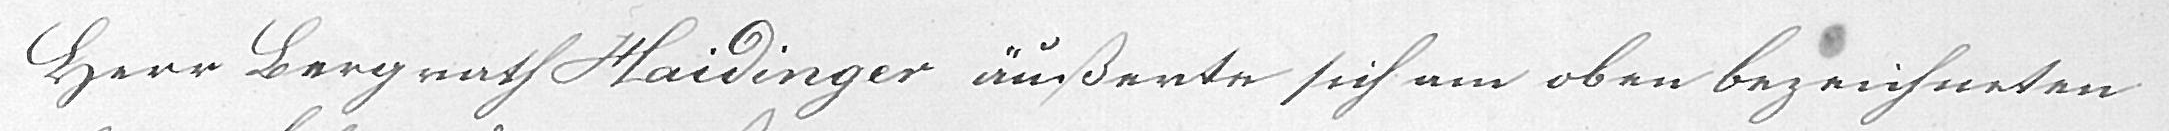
Herr Bergrath Haidinger äußerte sich am oben bezeichneten
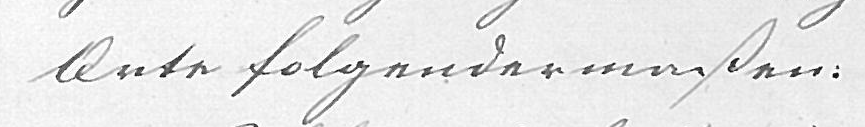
Orte folgendermaßen:
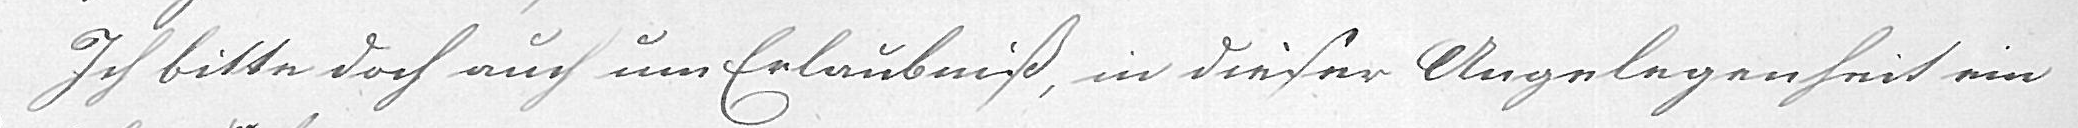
Ich bitte doch auch um Erlaubniß, in dieser Angelegenheit ein
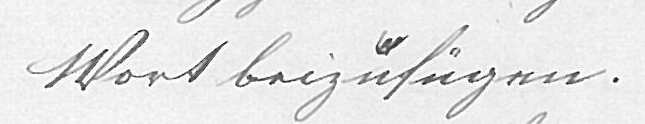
Wort beizufügen.
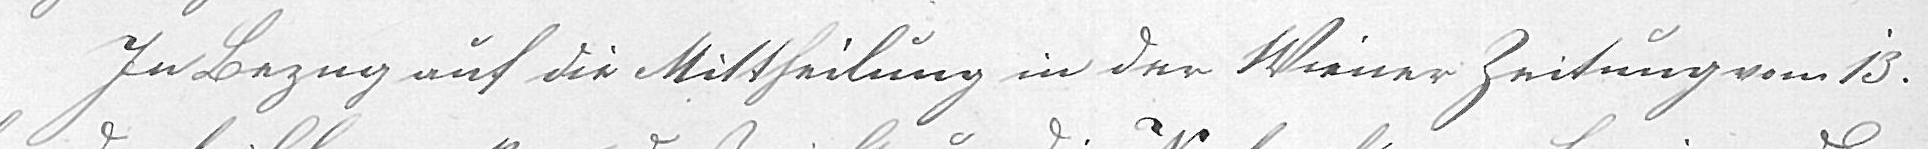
In Bezug auf die Mittheilung in der Wiener Zeitung vom 13.
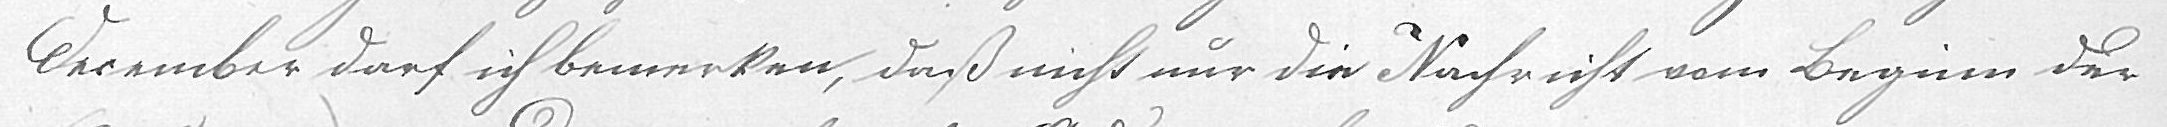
December darf ich bemerken, daß nicht nur die Nachricht vom Beginn der
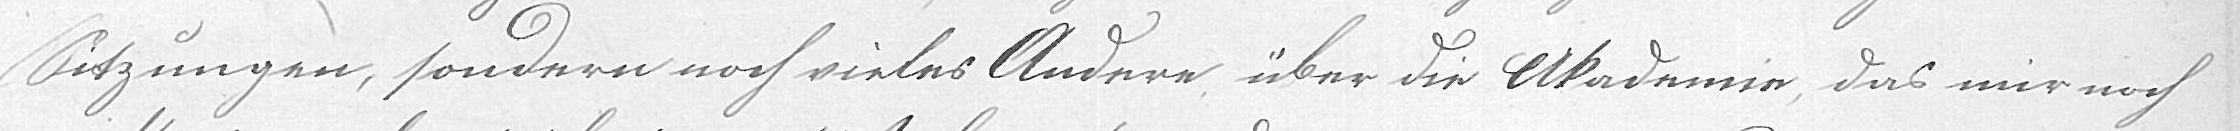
Sitzungen, sondern noch vieles Andere über die Akademie, das mir noch
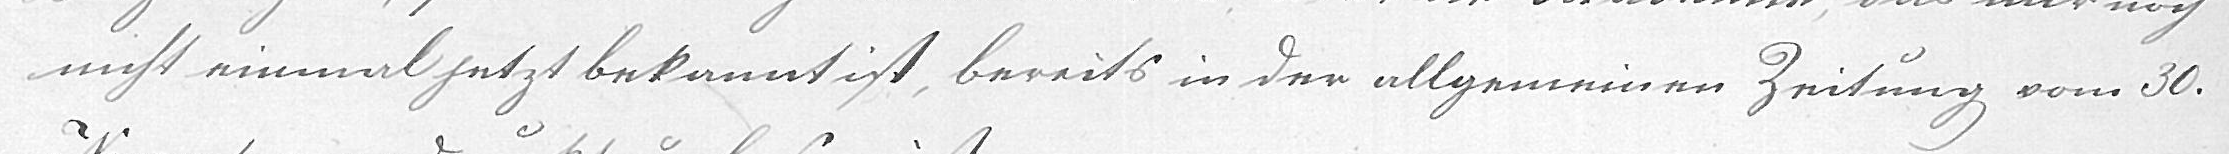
nicht einmal jetzt bekannt ist, bereits in der allgemeinen Zeitung vom 30.
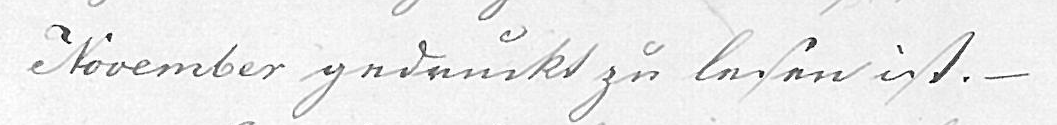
November gedruckt zu lesen ist.
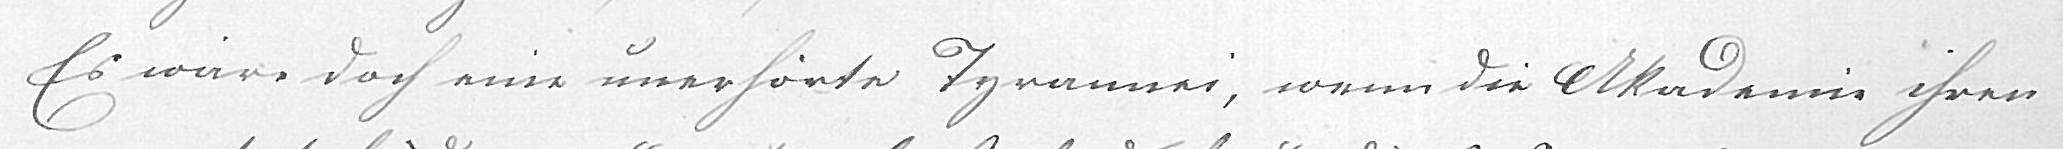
Es wäre doch eine unerhörte Tyrannei, wenn die Akademie ihrer
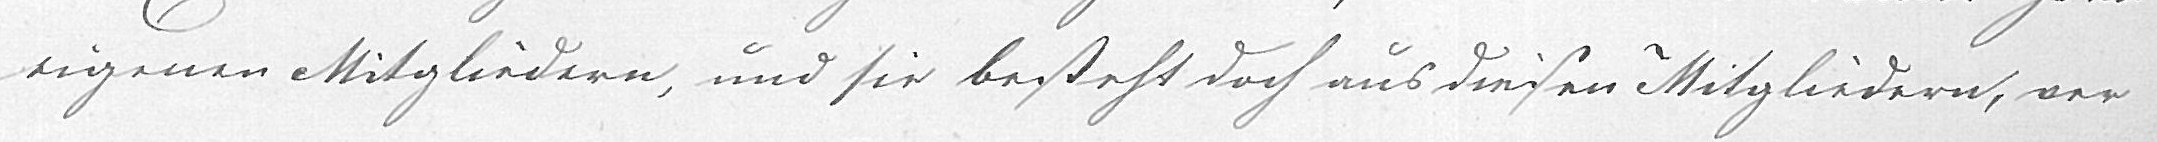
eigenen Mitgliedern, und die besteht doch aus diesen Mitgliedern, ver
